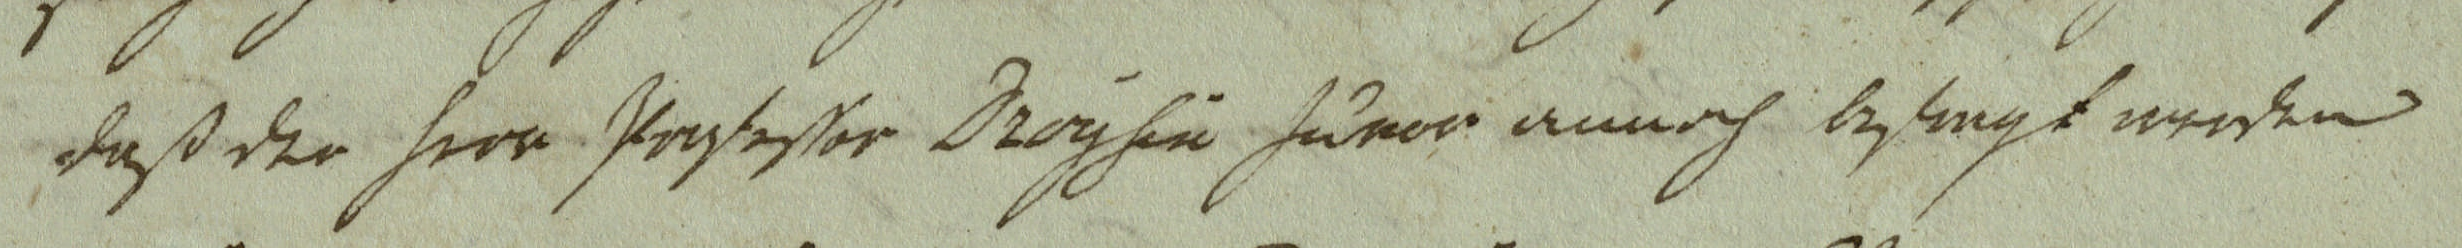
daß der Herr Professor Droÿsen zuvor annoch befragt werden
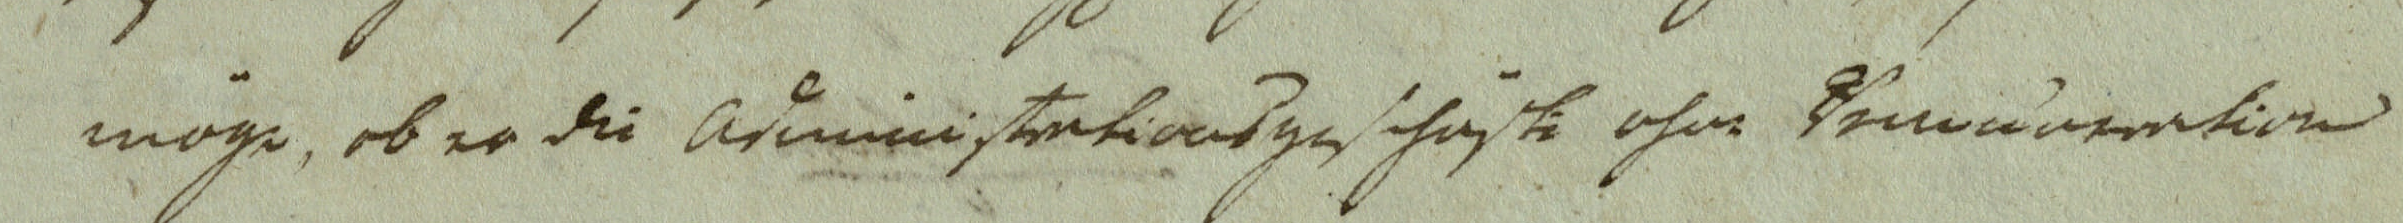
möge, ob er die Administrationsgeschäfte ohne Remuneration
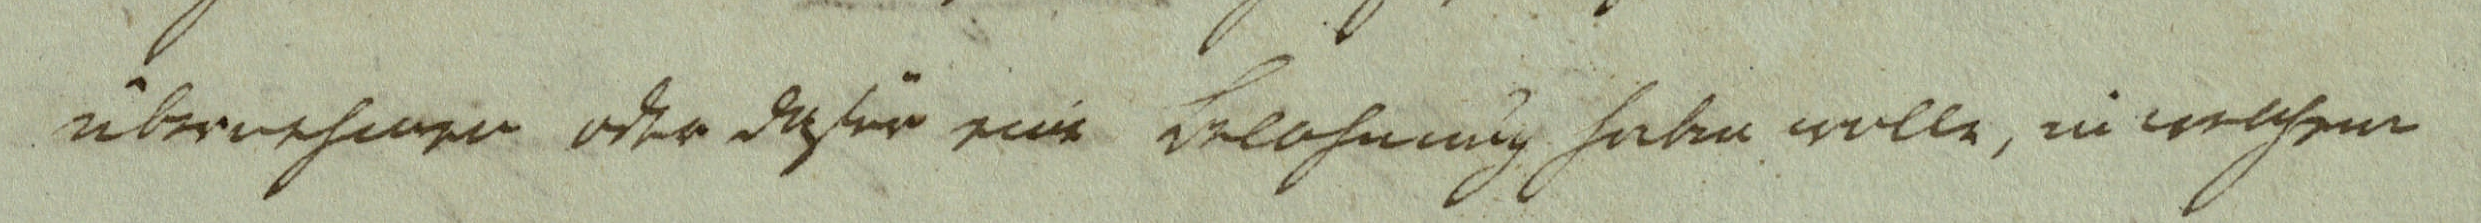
übernehmen oder dafür eine Belohnung haben wolle, in welchem
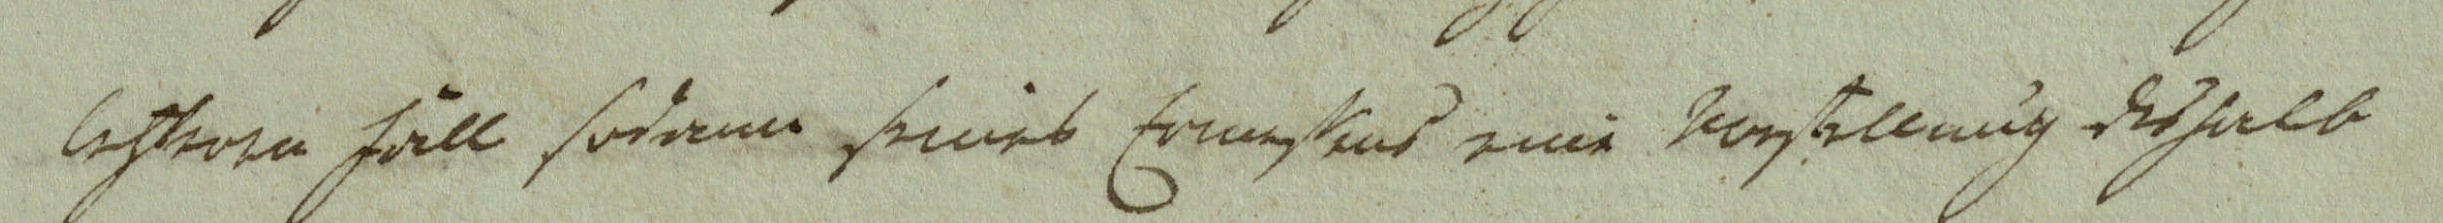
letzteren Fall sodann seines Ermessens eine Vorstellung deshalb
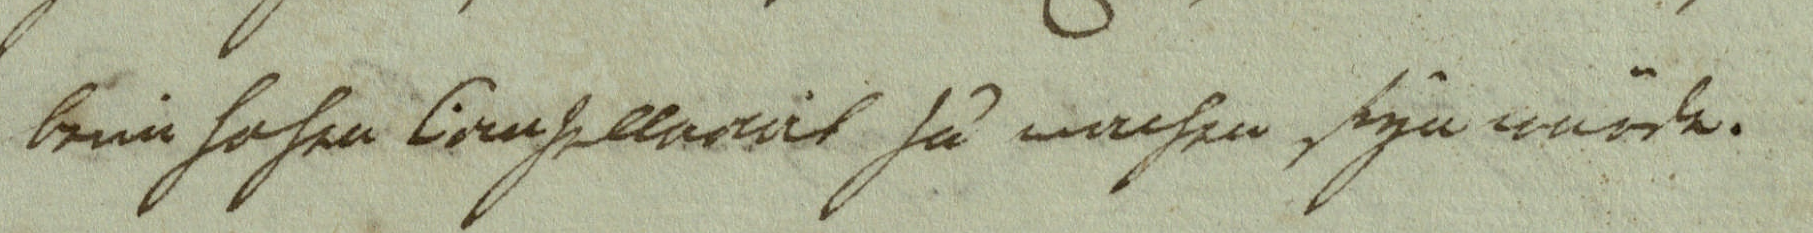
beim hohen Canzellariat zu machen seÿn würde.
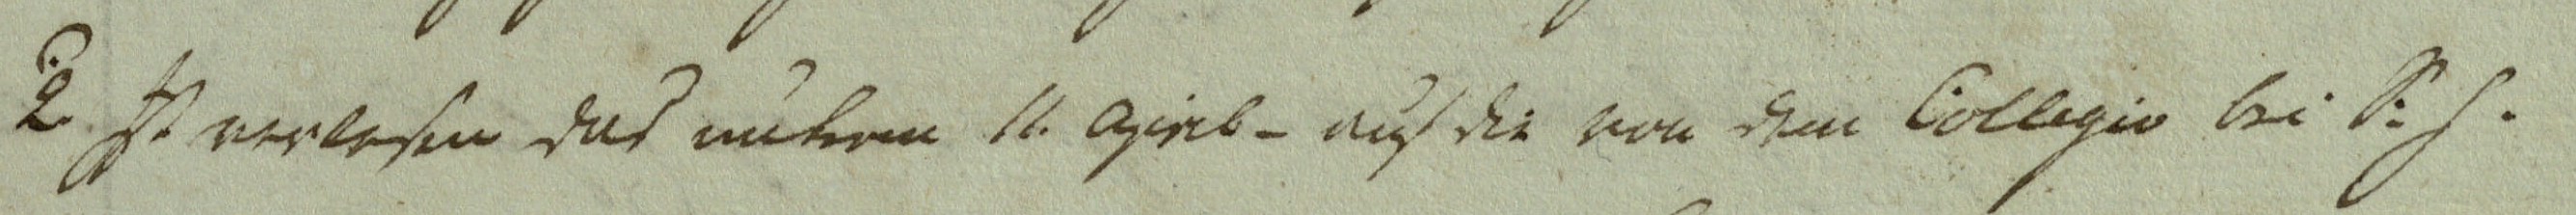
2. Ist verlesen das unterm 11. April auf die von dem Collegio bei Sr. h.
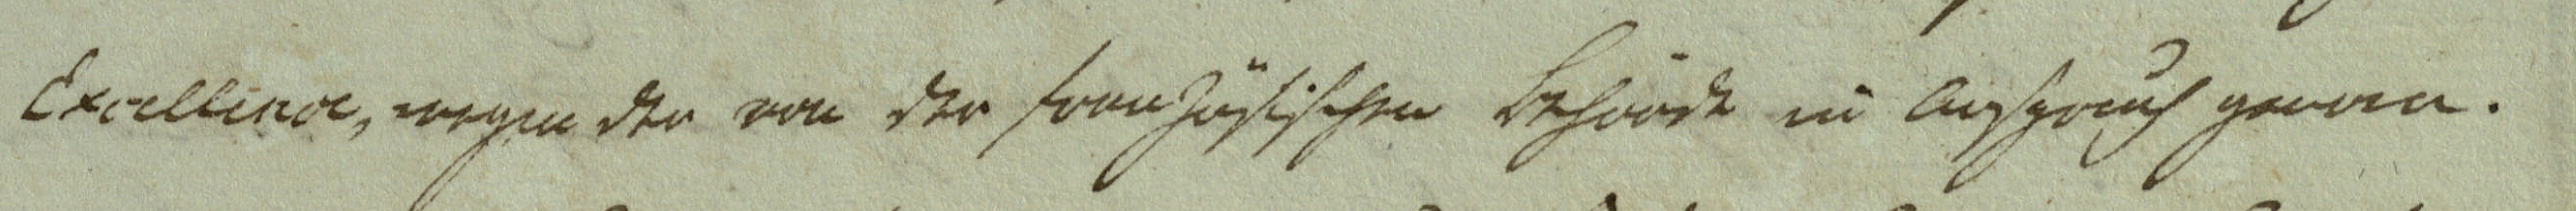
Excellence, wegen der von der französischen Behörde in Anspruch genom¬
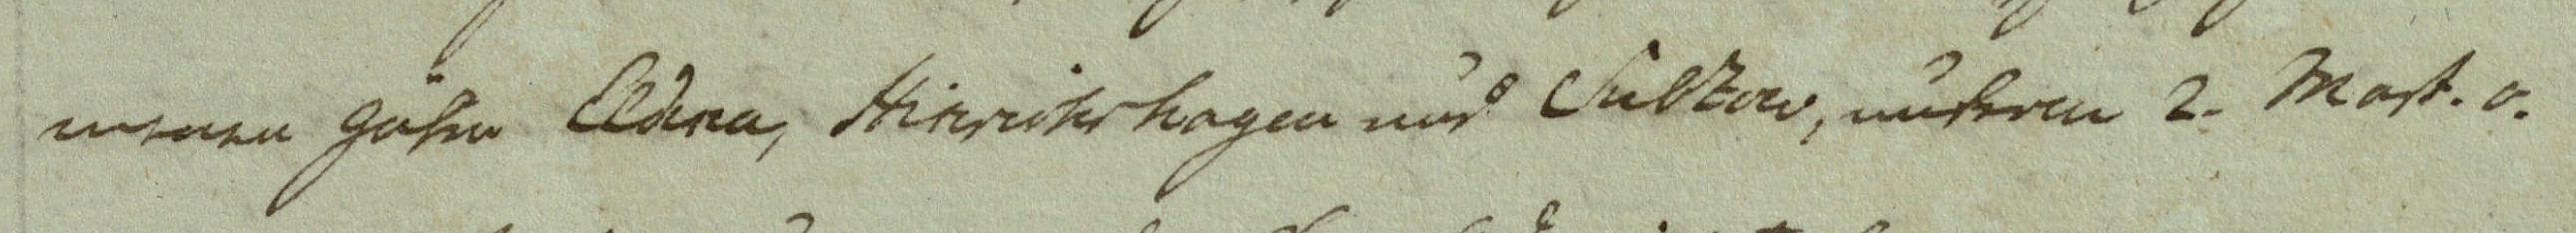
menen Güter Eldena, Hinrichshagen und Subzow, unterm 2. Mart. c.
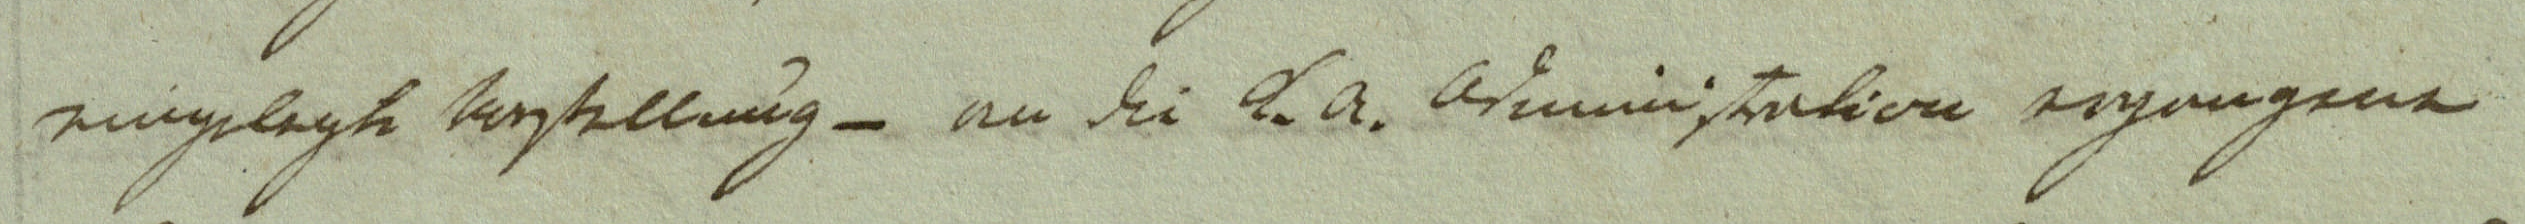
eingelegte Vorstellung an die K. A. Administration ergangene
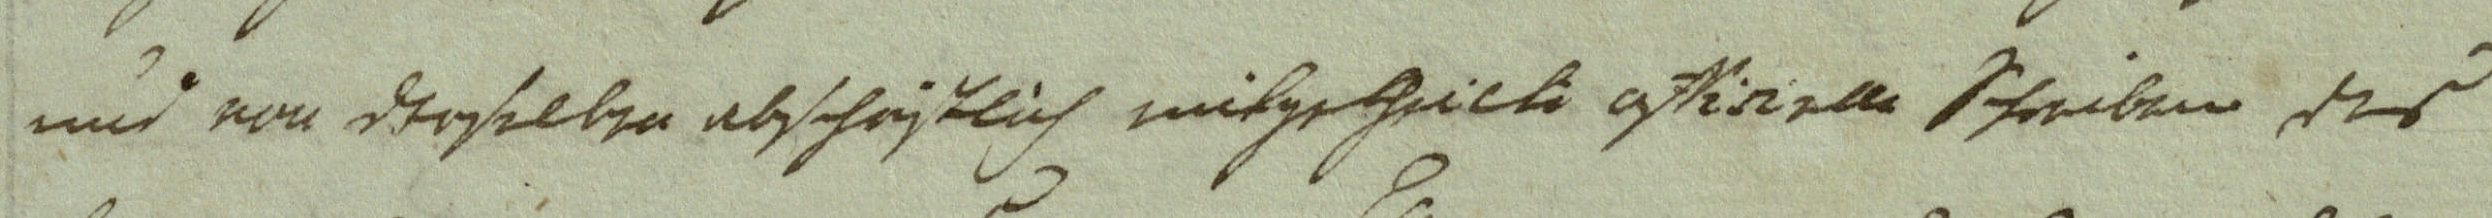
und von derselben abschriftlich mitgetheilte officielle Schreiben des
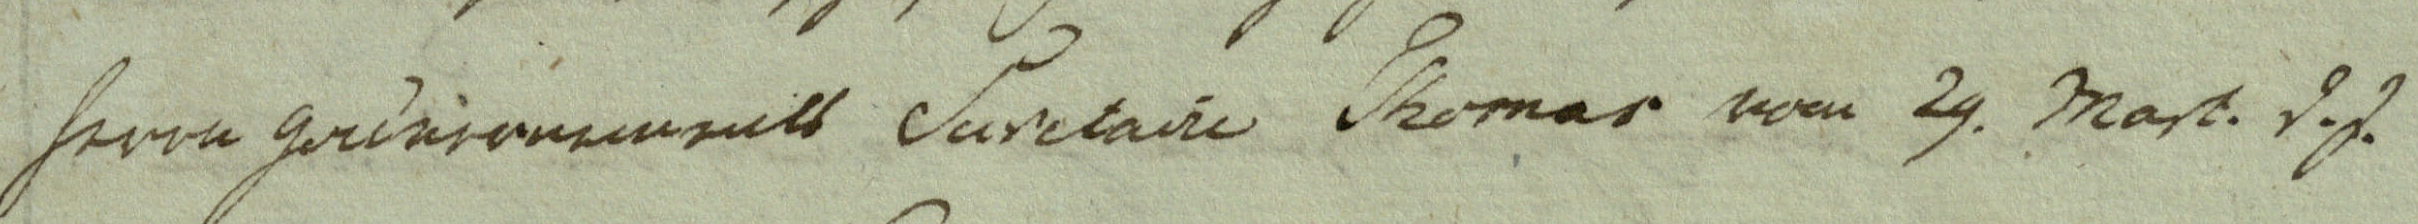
Herrn Gouvernements Secretaire Thomas vom 29. Mart. d. J.
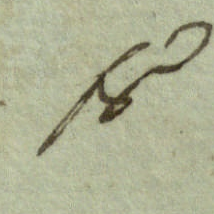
Es
